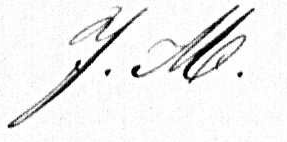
JM
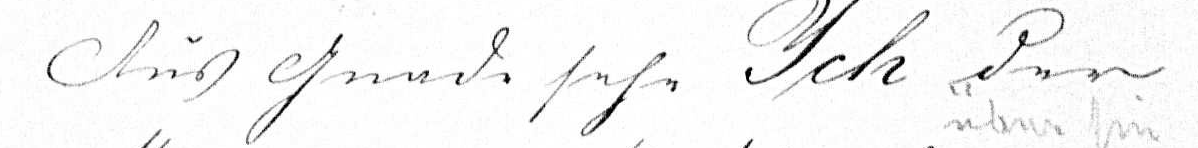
Aus Gnade sehe ich der
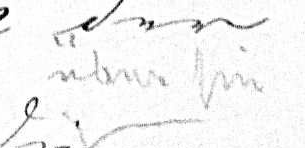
über sie
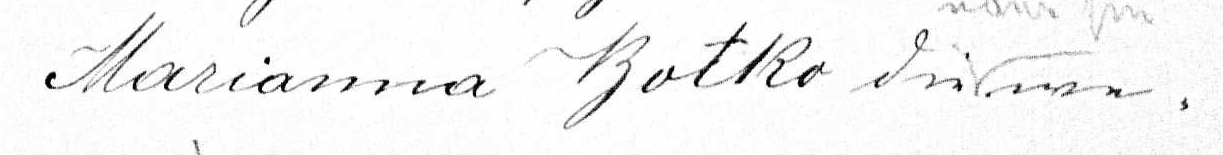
Marianna Botko die we¬
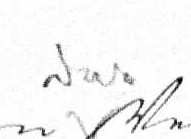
der
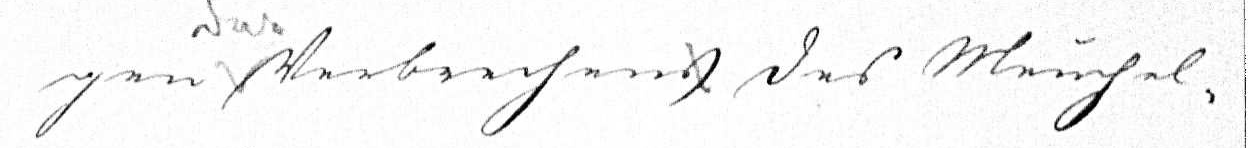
gen Verbrechen des Meuchel¬
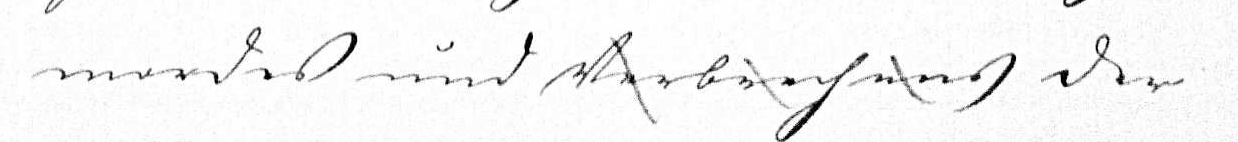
mordes und der
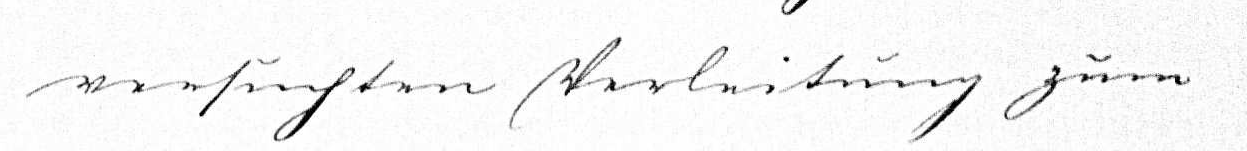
versuchten Verleitung zum
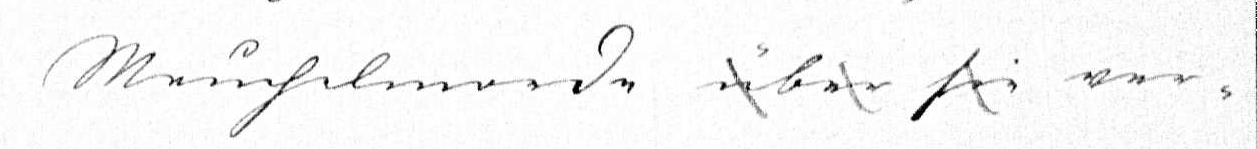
Meuchelmorde ver¬
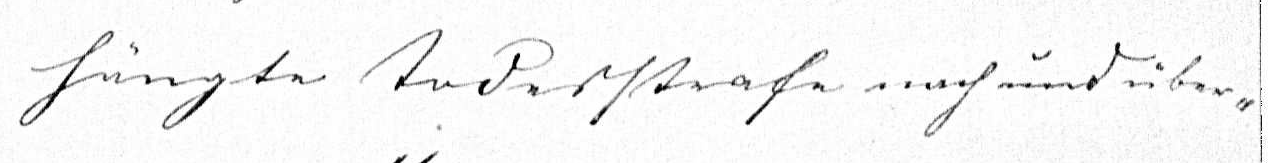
hängte Todesstrafe nach, und über¬
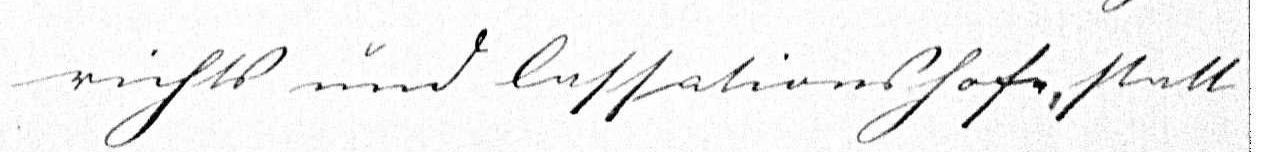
richts- und Cassationshofe, statt
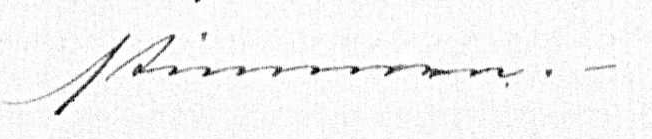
stimmen.
